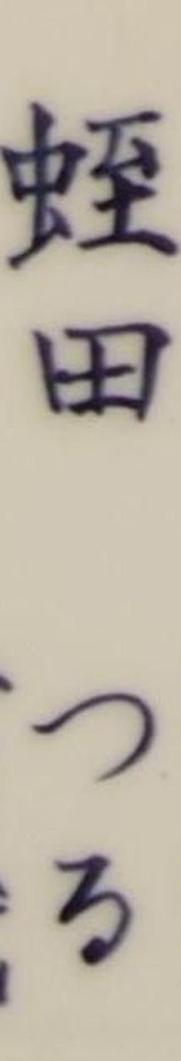蛭田つる

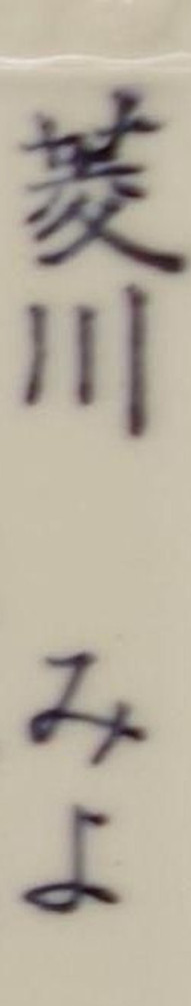菱川みよ
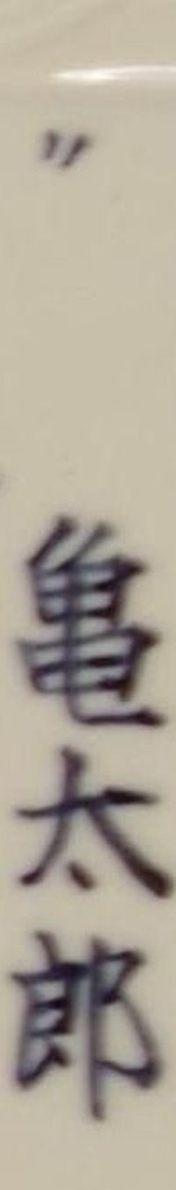亀太郎
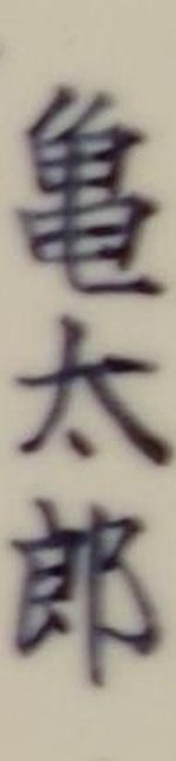亀太郎
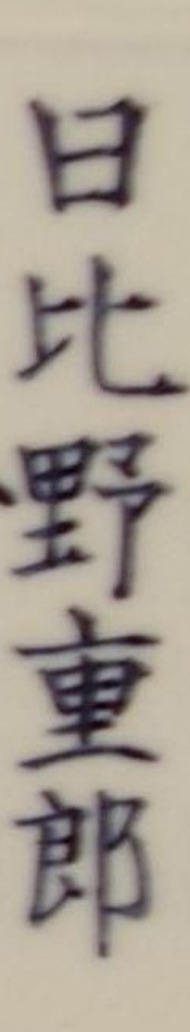日比野重郎
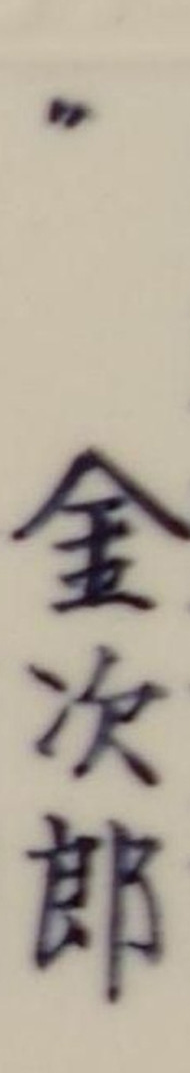金次郎
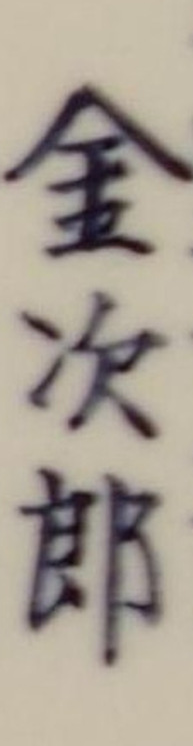金次郎
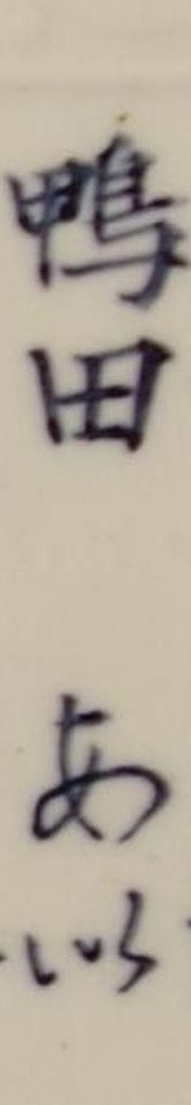鴨田あい
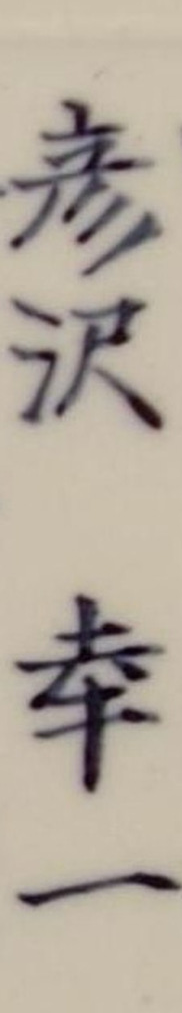彦沢幸一
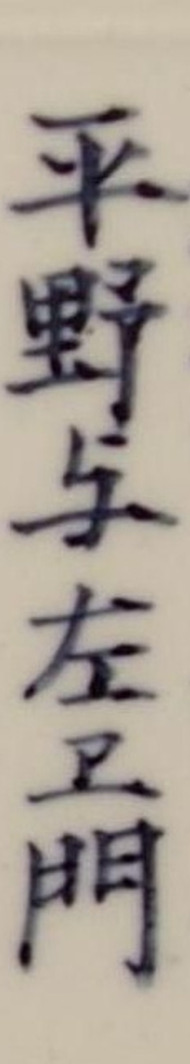平野与左ヱ門
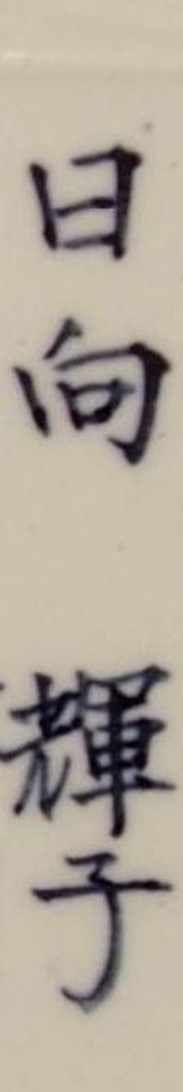日向輝子
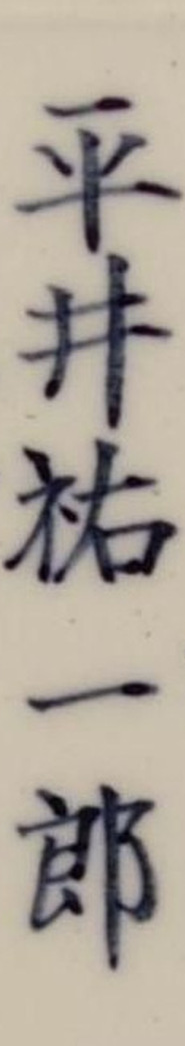平井祐一郎
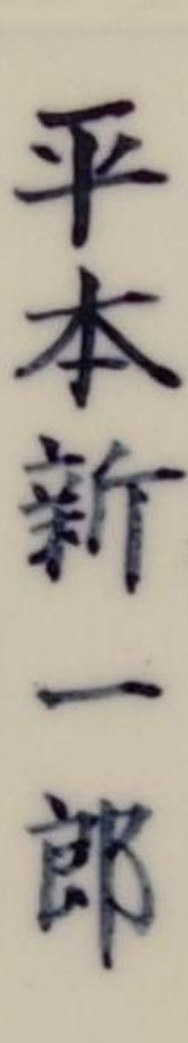平本新一郎
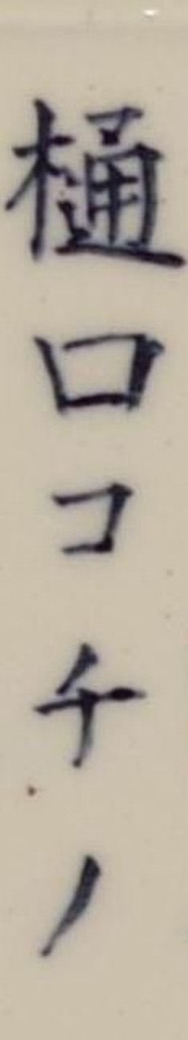樋口コチノ
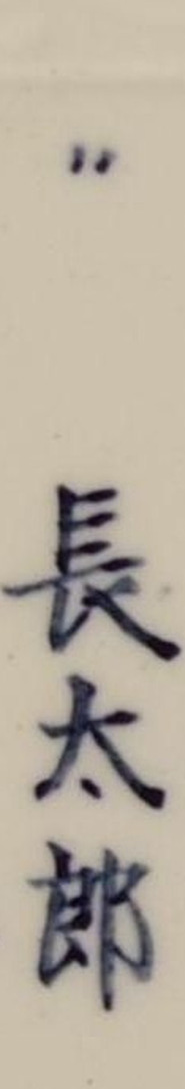長太郎
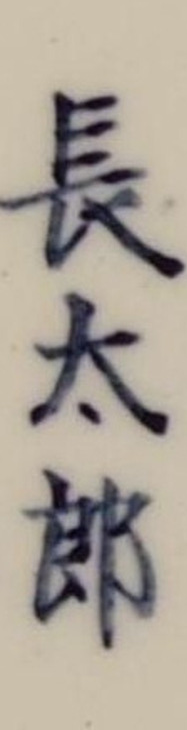長太郎
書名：E~L
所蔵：高野山金剛峯寺
